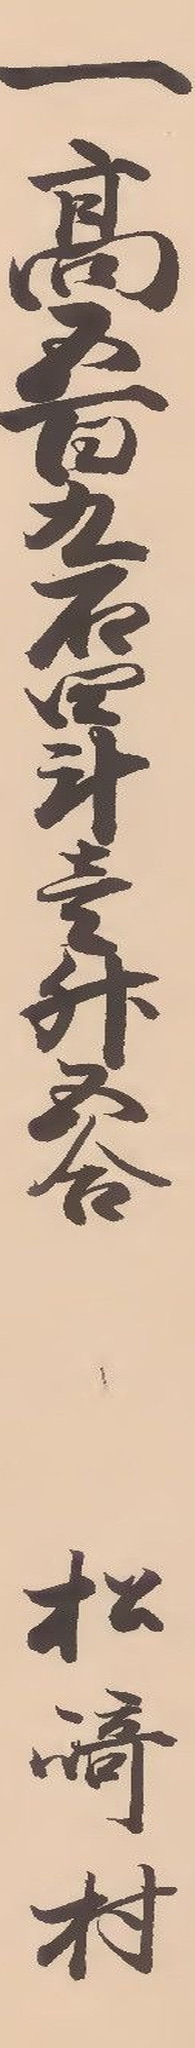一高五百九石四斗壱升五合松崎村
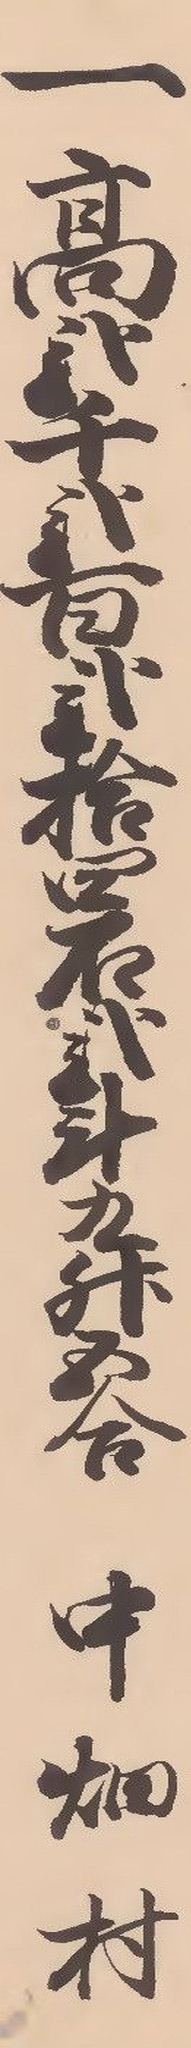一高弐千弐百弐拾四石弐斗九升五合中畑村
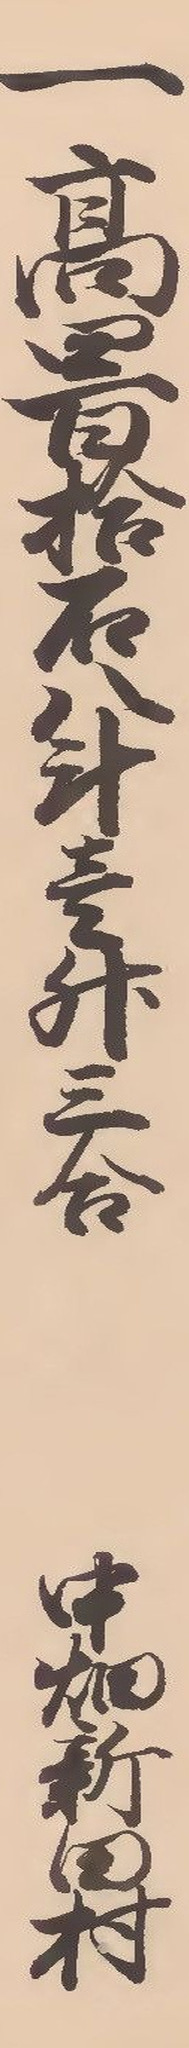一高四百拾石八斗壱升三合中畑新田村
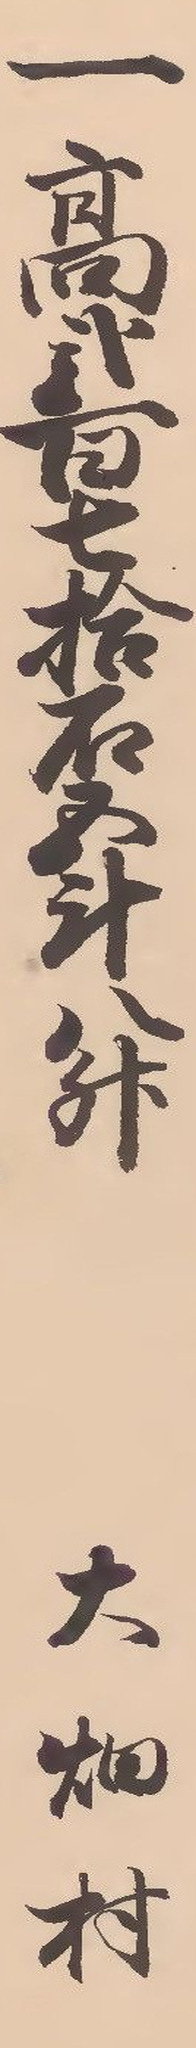一高弐百七拾石五斗八升大畑村

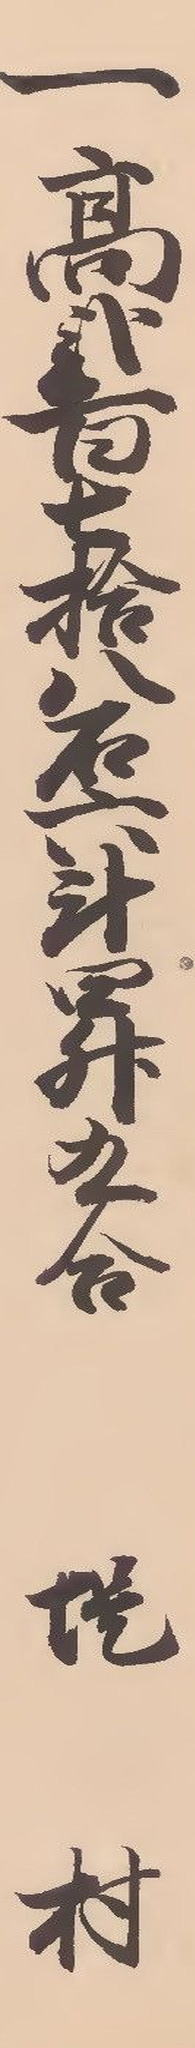一高弐百七拾八石六斗四升九合堤村
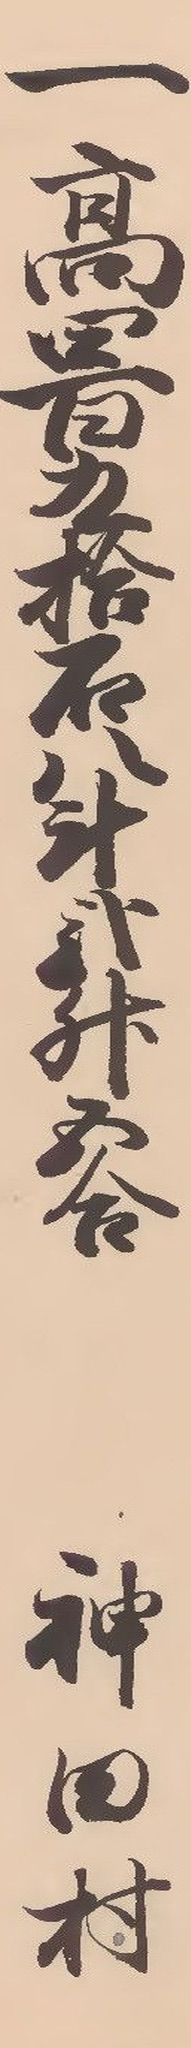一高四百九拾石八斗弐升五合神田村
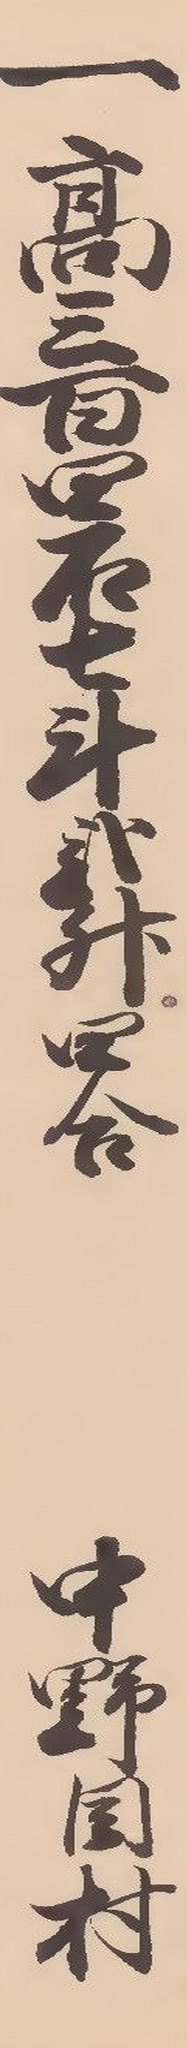一高三百四石七斗弐升四合中野目村
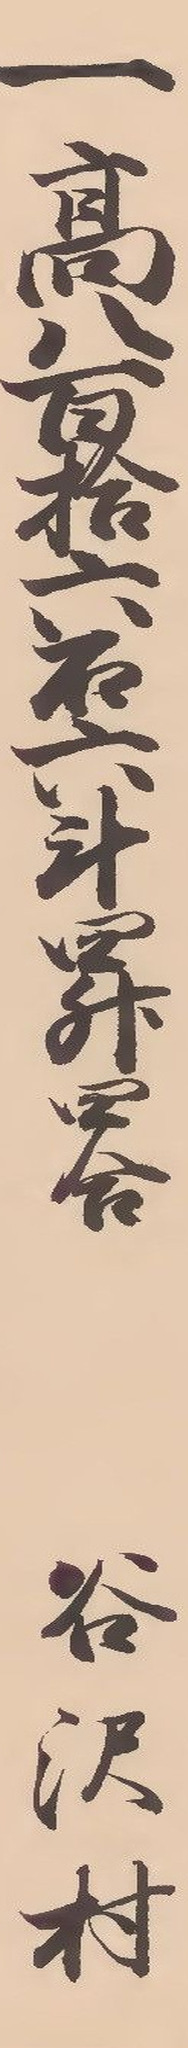一高八百拾六石六斗四升四合谷沢村
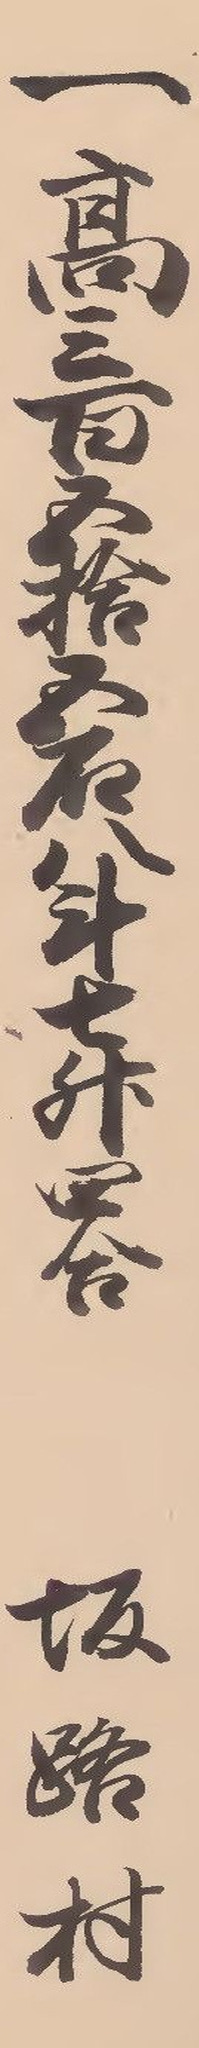一高三百五拾五石八斗七升四合坂路村
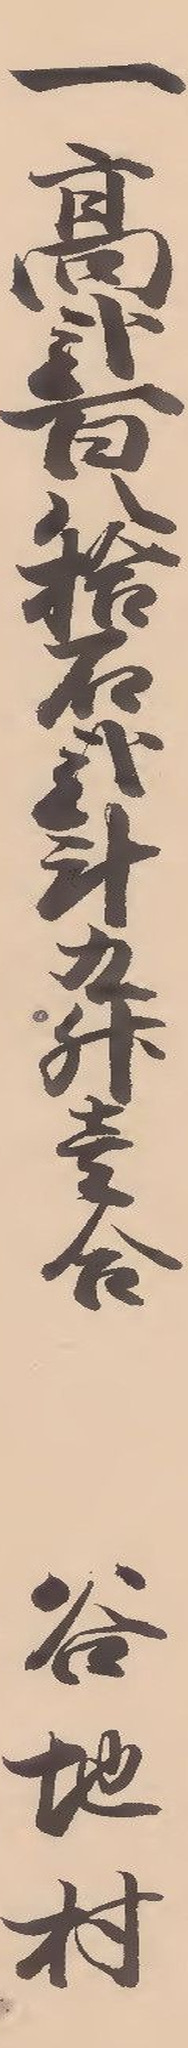一高弐百八拾石弐斗九升壱合谷地村
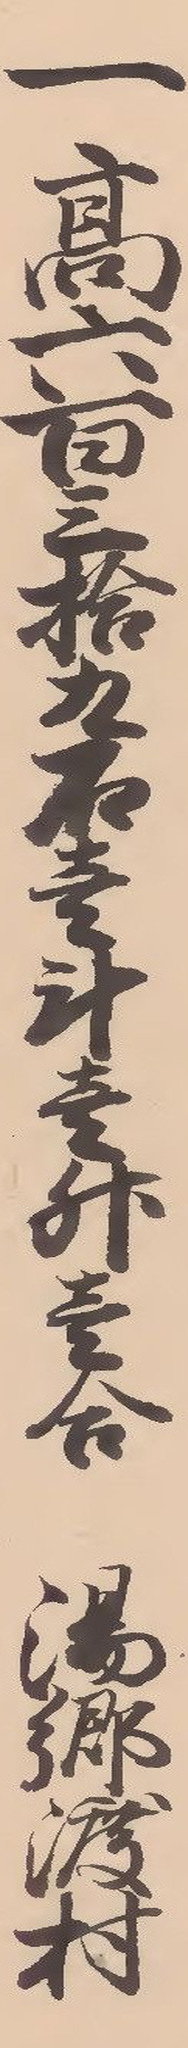一高六百三拾九石壱斗壱升壱合湯郷渡村
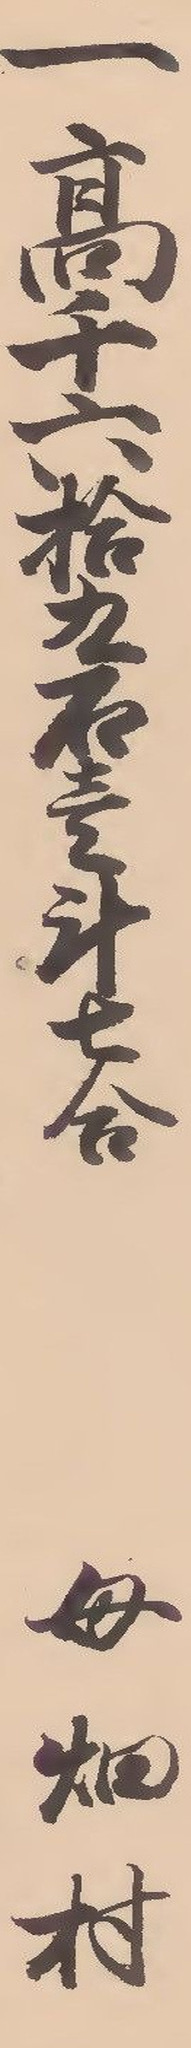一高千六拾九石壱斗七合母畑村

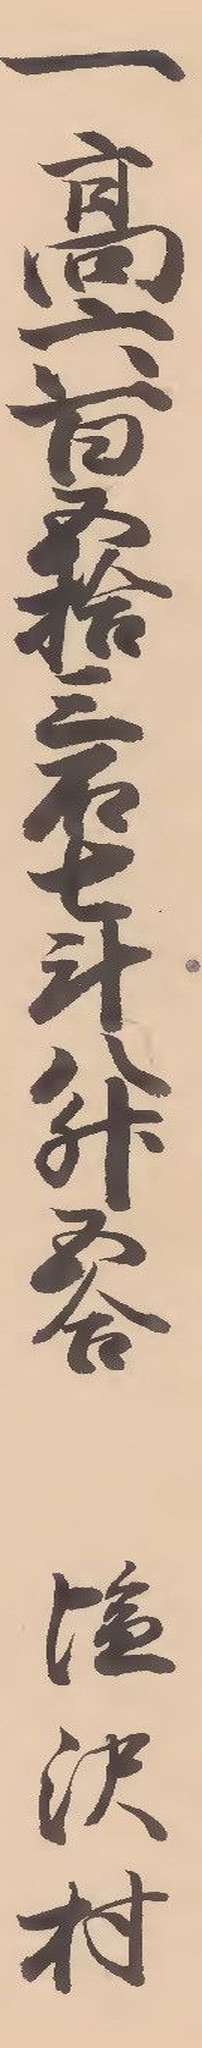一高六百五拾三石七斗八升五合塩沢村
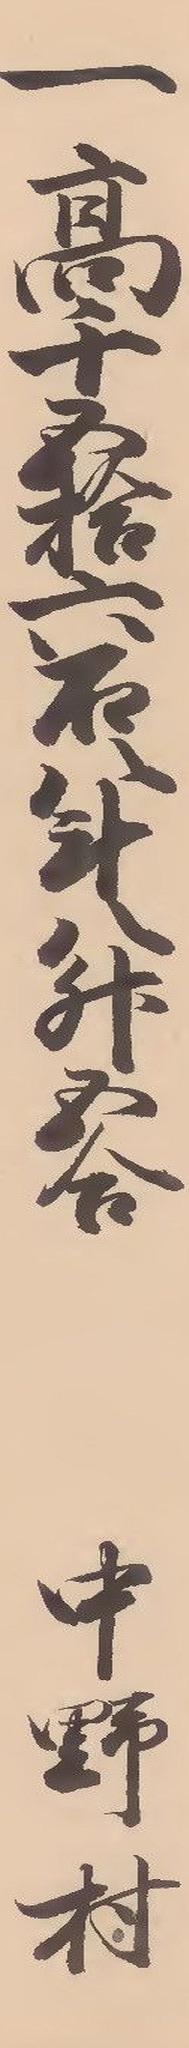一高千五拾六石八斗八升五合中野村
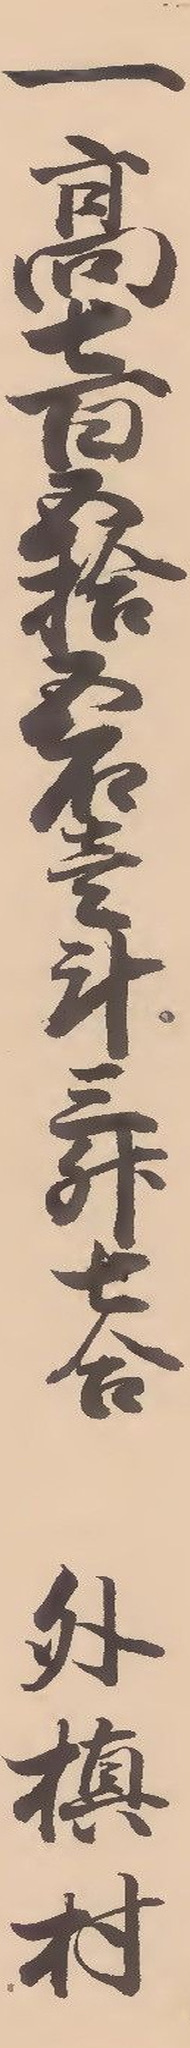一高七百五拾五石壱斗三升七合外槙村
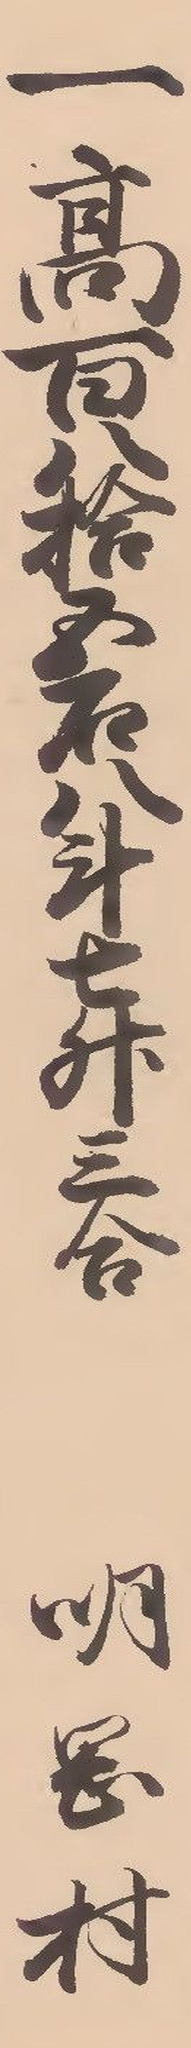一高百八拾五石八斗七升三合明岡村
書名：陸奥国郷帳　２
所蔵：国立公文書館 National Archives of Japan
